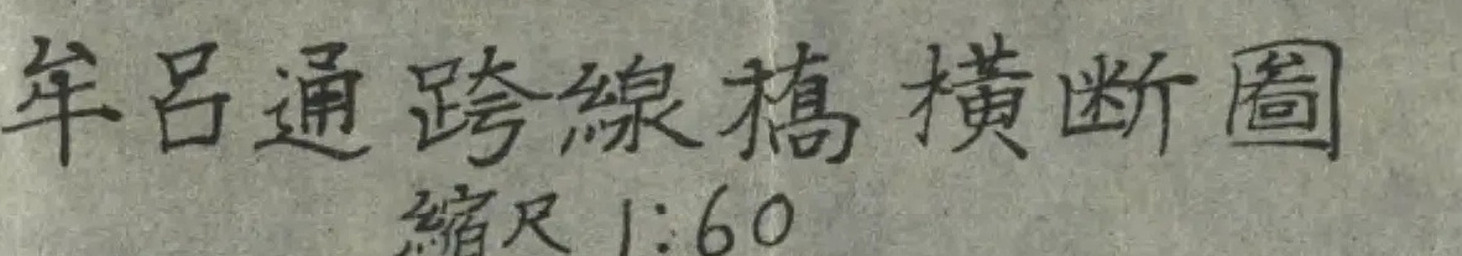牟呂通跨線橋横断図
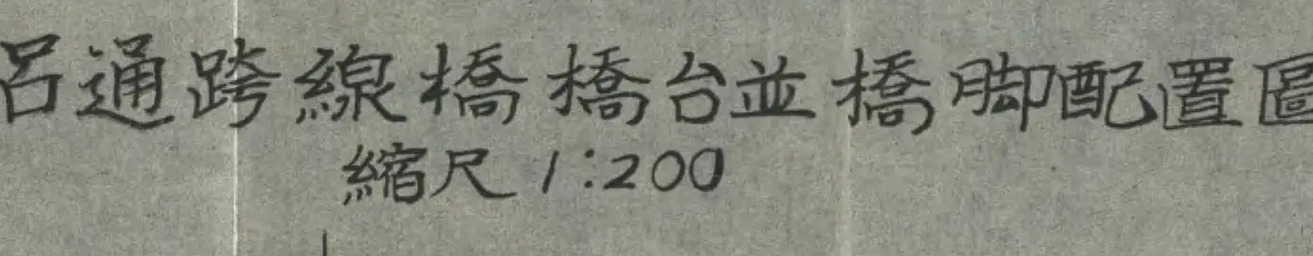牟呂通跨線橋橋台並橋脚配置図

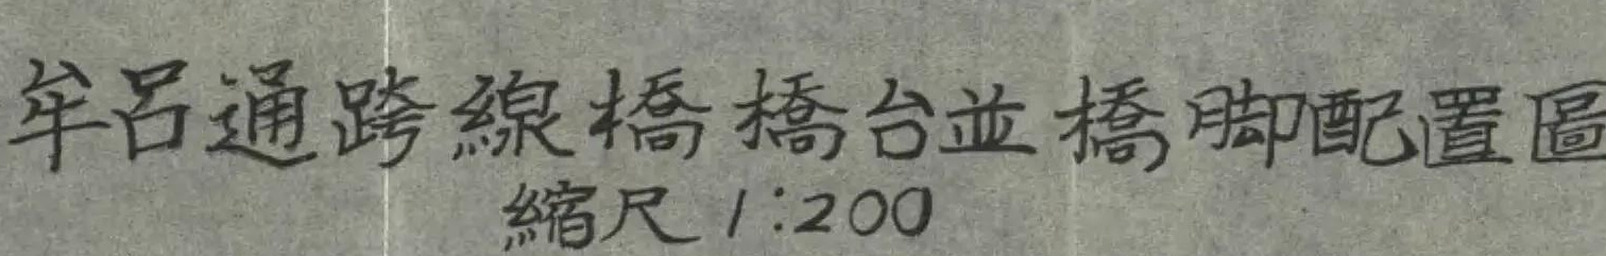牟呂通跨線橋橋台並橋脚配置図

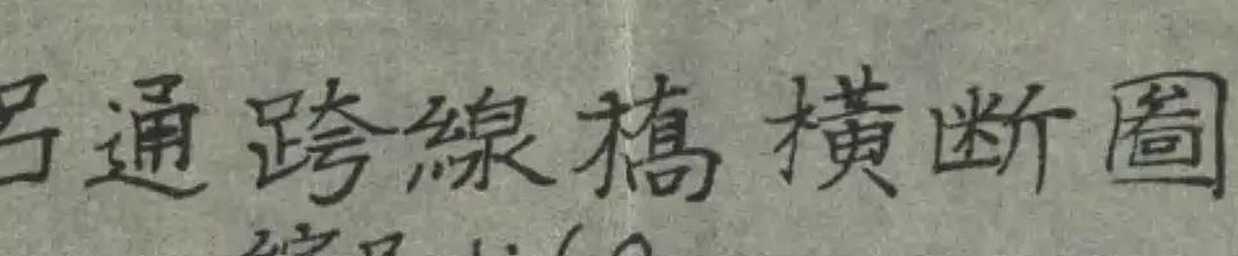牟呂通跨線橋横断図
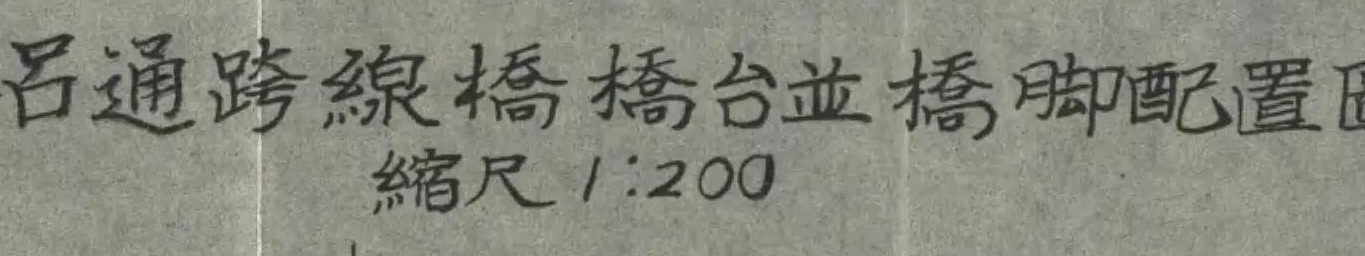牟呂通跨線橋橋台並橋脚配置図

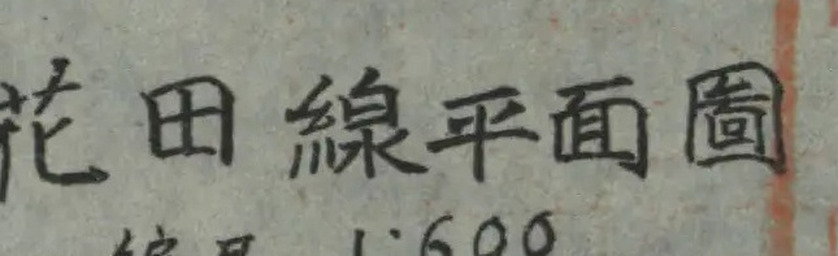花田線平面図
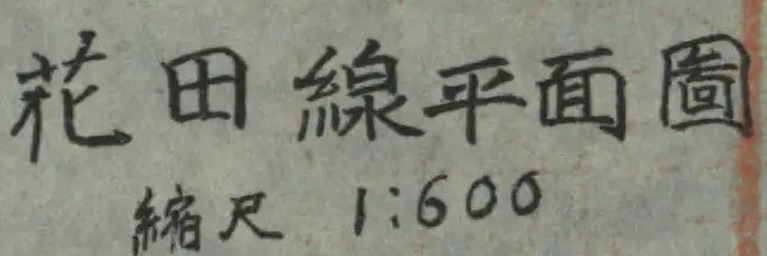花田線平面図
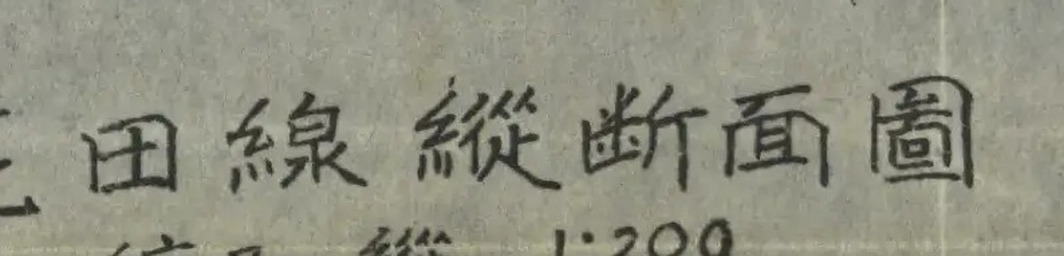花田線縦断面図
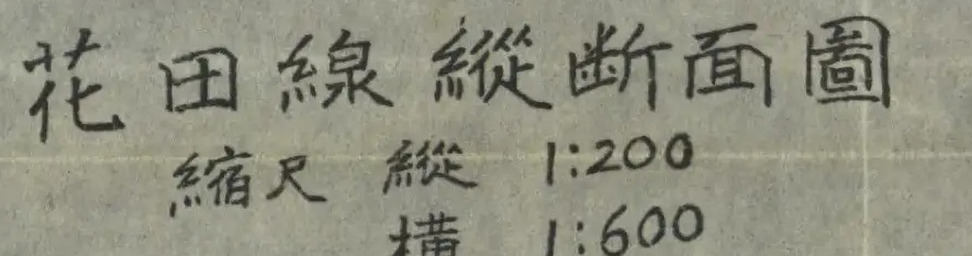花田線縦断面図

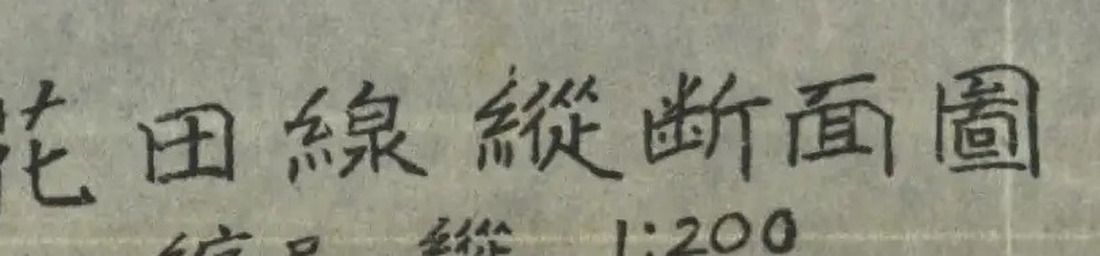花田線縦断面図
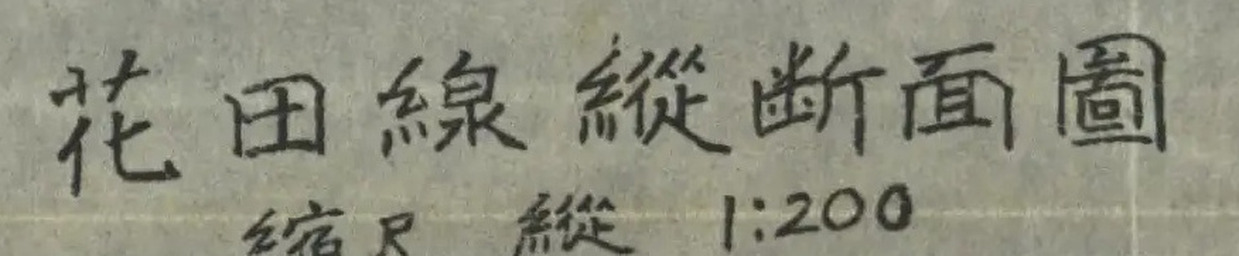花田線縦断面図

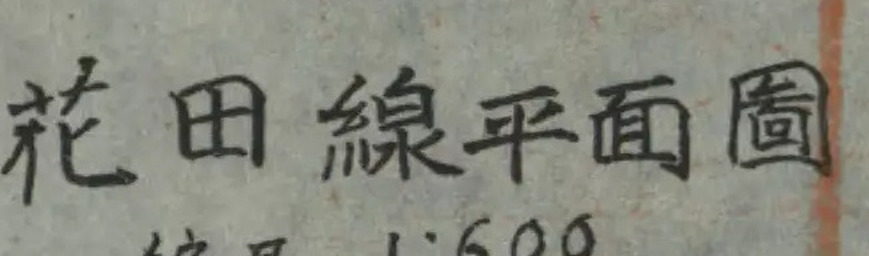花田線平面図
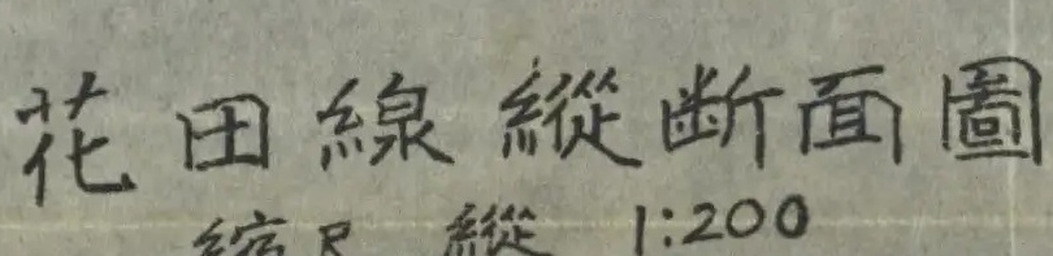花田線縦断面図
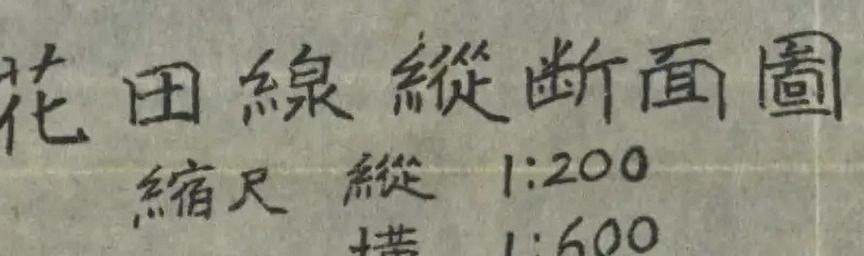花田線縦断面図

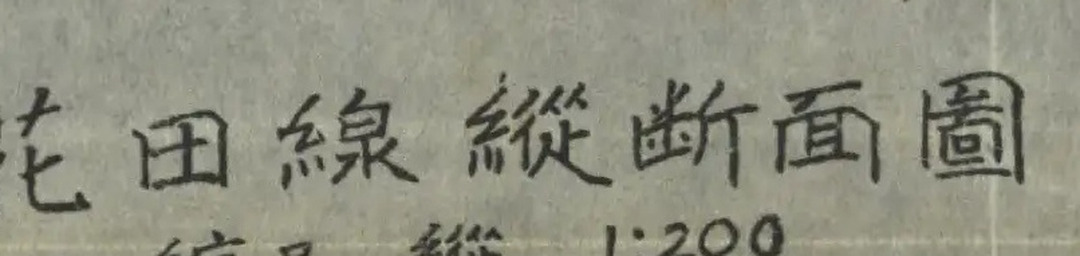花田線縦断面図
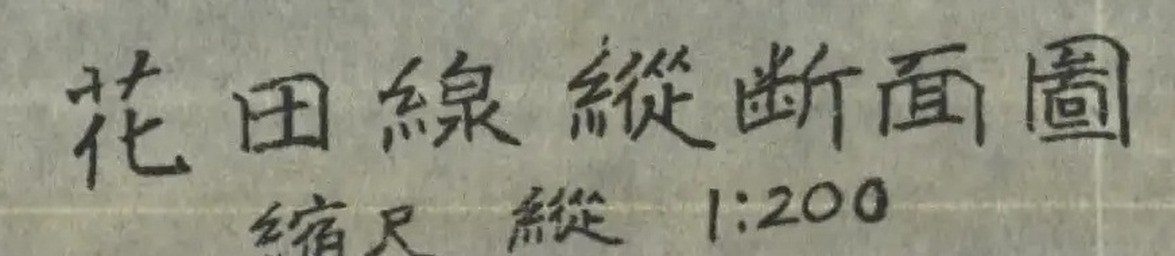花田線縦断面図
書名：豊橋市都市計画第一期事業報告書
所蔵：国立国会図書館 National Diet Library, JAPAN
